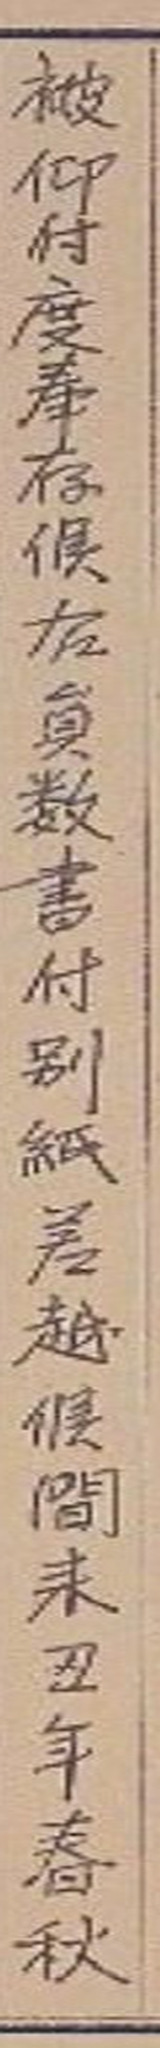被仰付度奉存候右員数書付別紙差越候間来丑年春秋
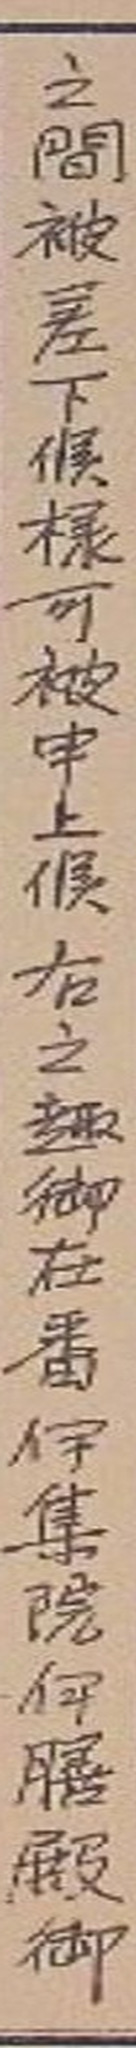之間被差下候様可被申上候右之趣御在番伊集院伊膳殿御
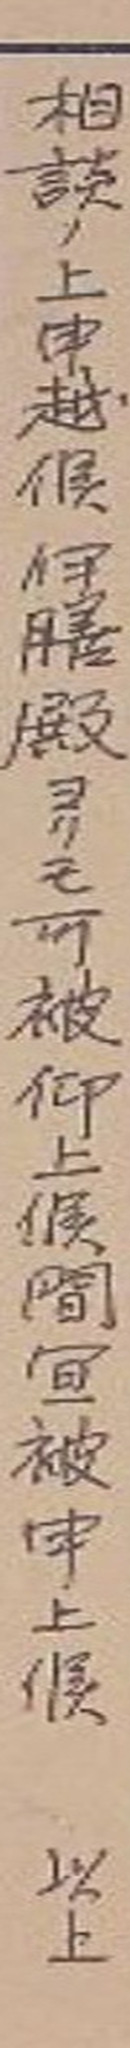相談の上申越候伊膳殿よりも可被仰上候間宜被申上候以上
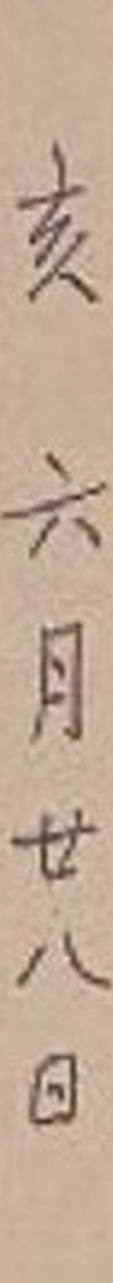亥六月廿八日
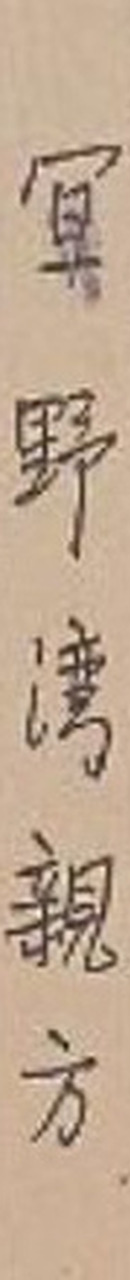宜野湾親方
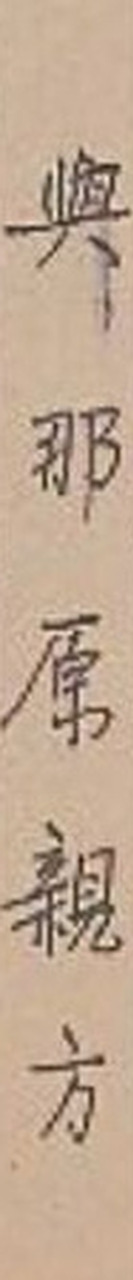与那原親方
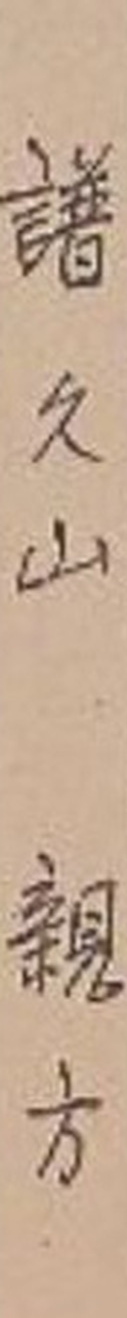譜久山親方
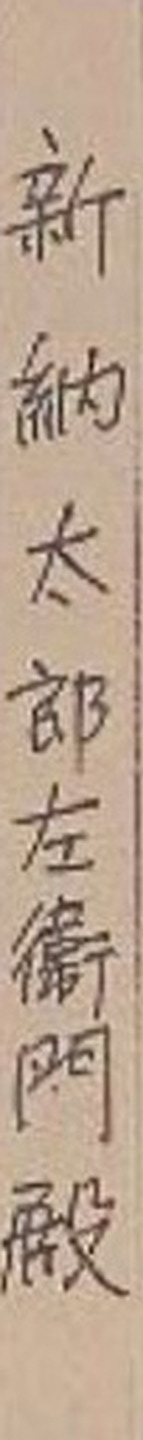新納太郎左衛門殿
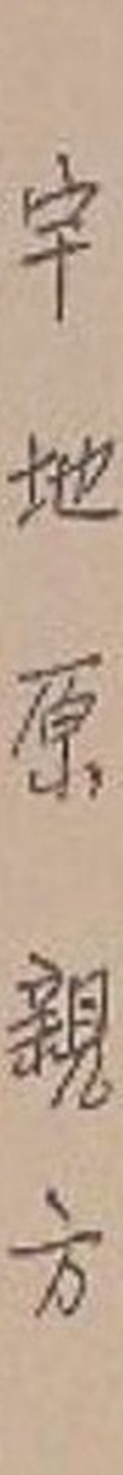宇地原親方
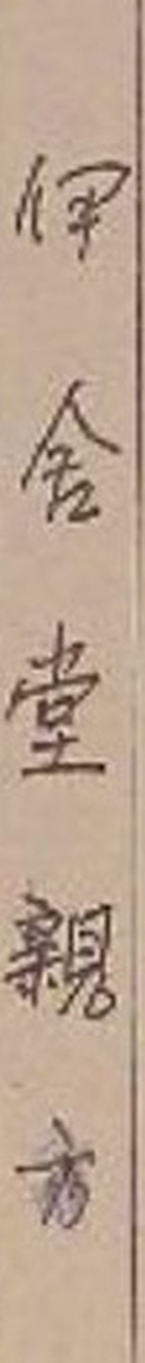伊舎堂親方

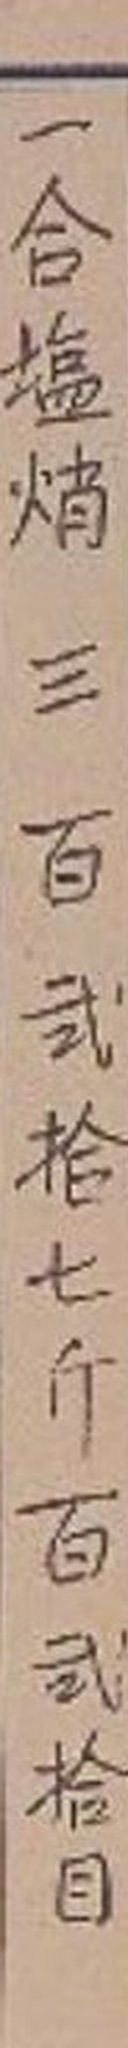一合塩硝三百弐拾七斤百弐拾目
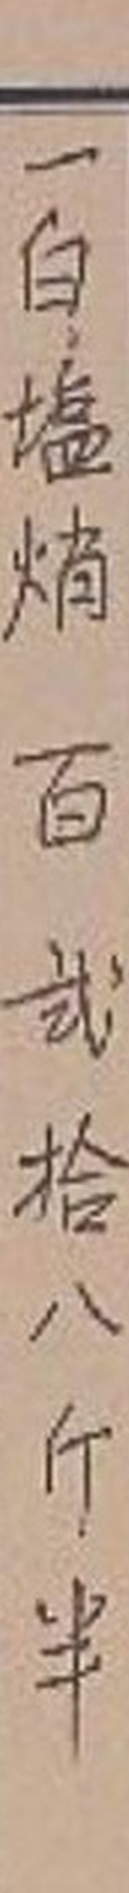一白塩硝百弐拾八斤半
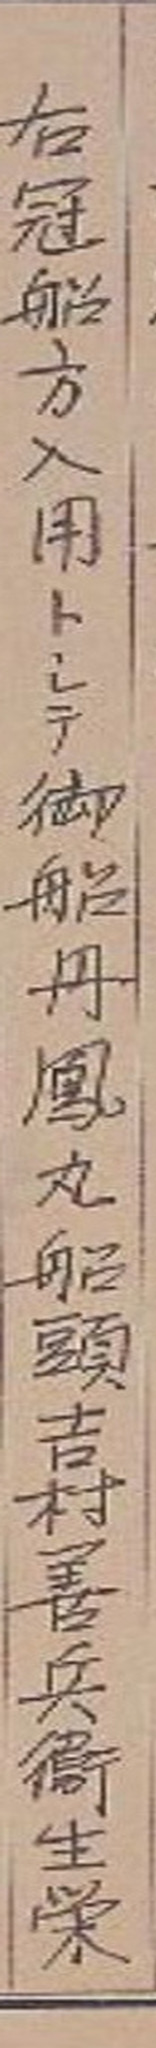右冠船方入用として御船丹鳳丸船頭吉村善兵衛生栄
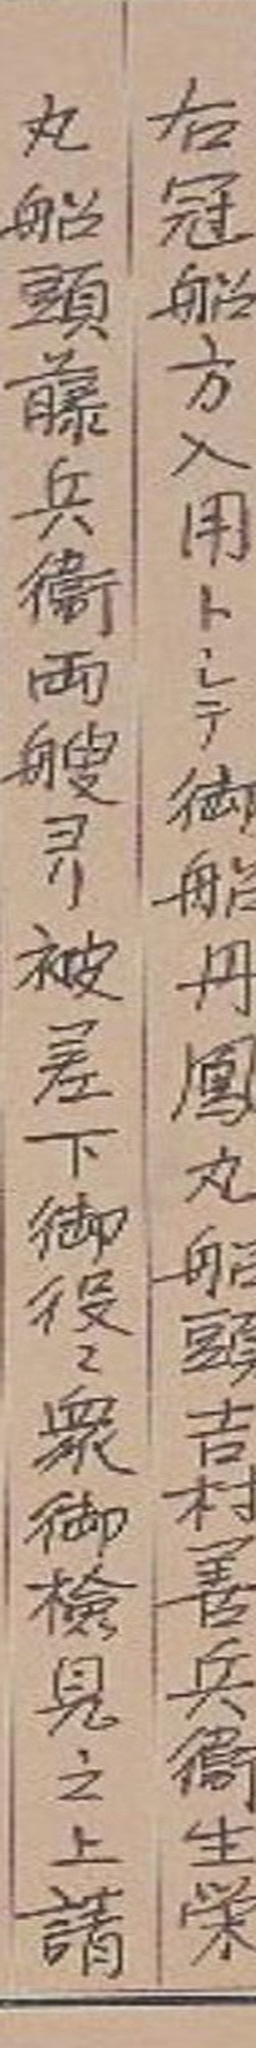丸船頭藤兵衛両艘より被差下御役々衆御検見之上請
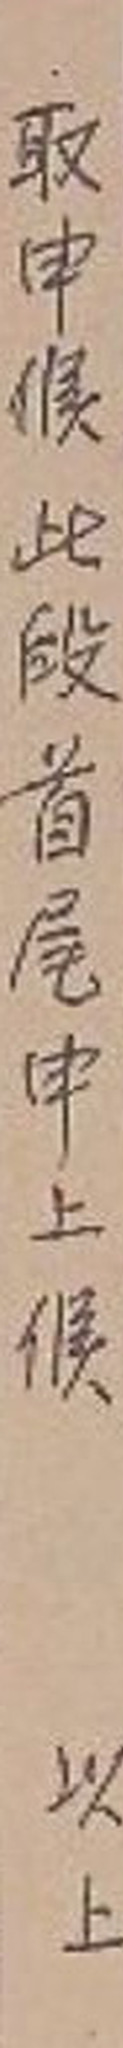取申候此段首尾申上候以上
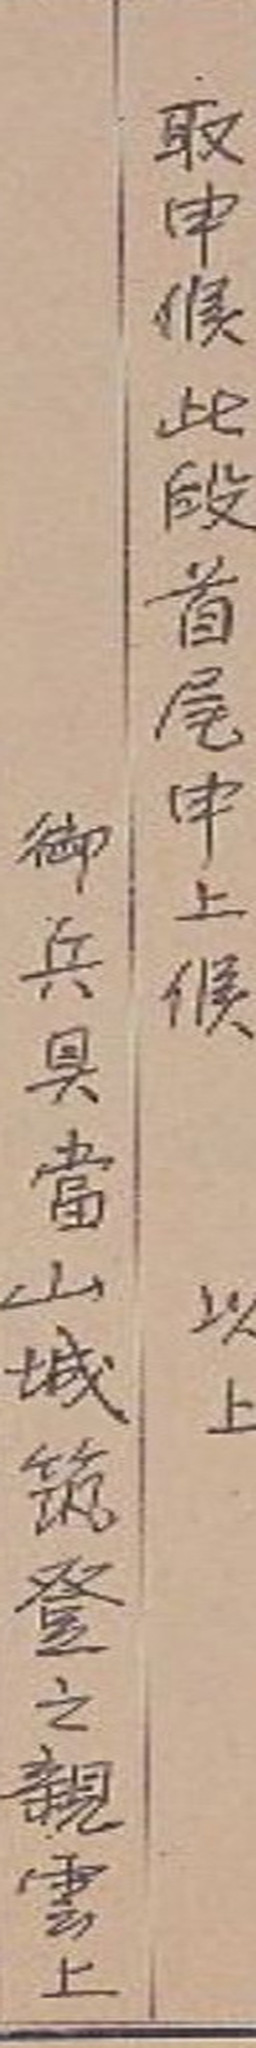御兵具当山城筑登之親雲上
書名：支那冊封使来琉諸記 下巻
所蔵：University of the Ryukyus Library
